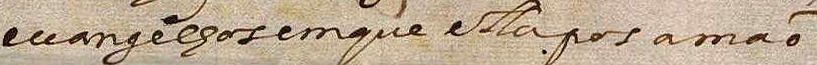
euangelhos em que ella pos a maõ
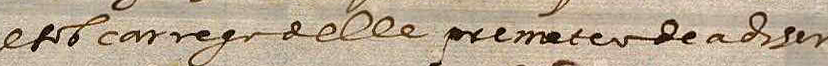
e sob carrego delle premeteo de a dizer
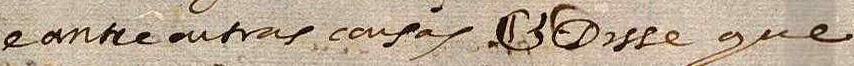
e antre outra cousas ⁋ Disse que
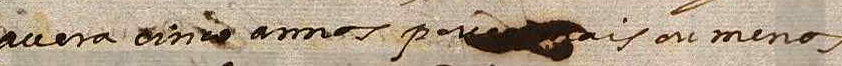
auera cinco annos pou_ _ais ou menos
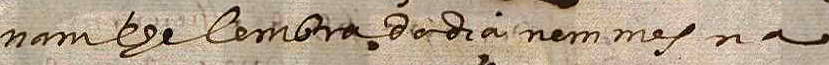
nam lhe lembra do dia nem mes na
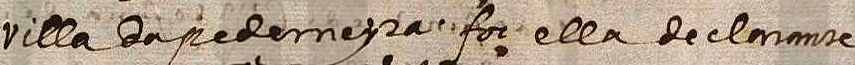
villa da pederneyra foi ella declarante
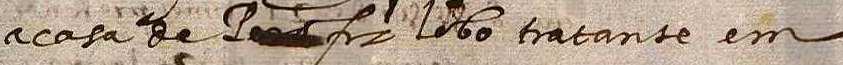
a casa de Pero frz̄ lobo tratante em
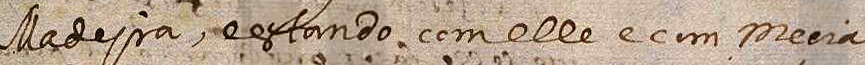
Madejra, e estando com elle e com mecia
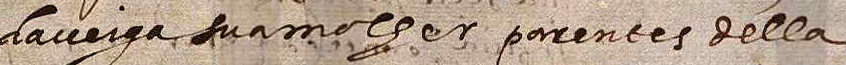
da ueiga sua molher parentes della
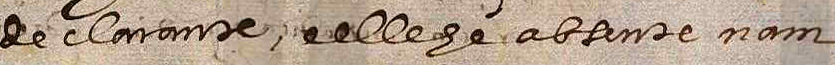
declarante, e ele he absente nam
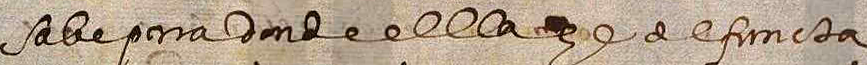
sabe pera donde ella he defuncta
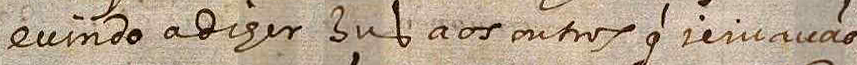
e uindo a dizer hūs aos outros q̄ ieiuauão
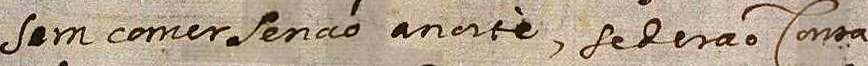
sem comer senão a noite, se deraõ Conta
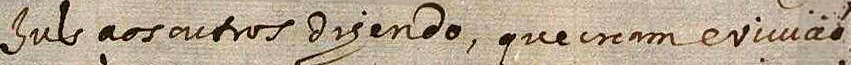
hūs aos outros dizendo, que criam e viuiaõ
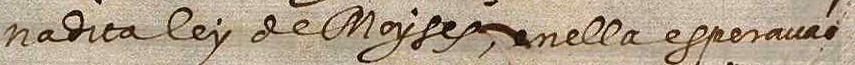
na dita ley de Moyses, e nella esperauaõ
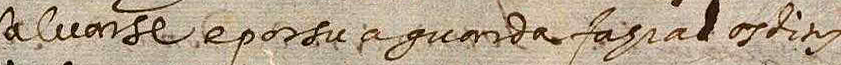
Saluarse e por sua guarda fazia_ os ditos
